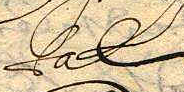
tal
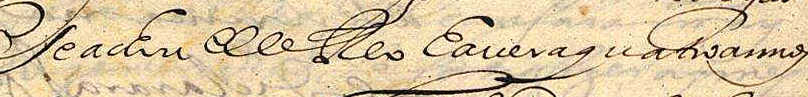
Se achou ele Reo hauera quatro annos
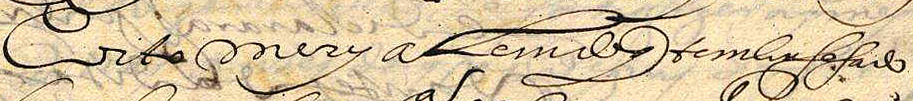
E oito mezes aLem do q̄ tem confesado
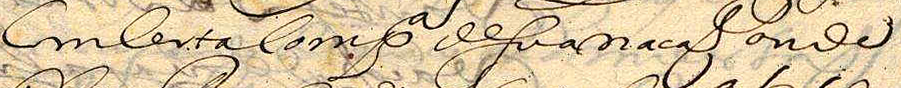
Com Certa Compa de sua naçaõ onde
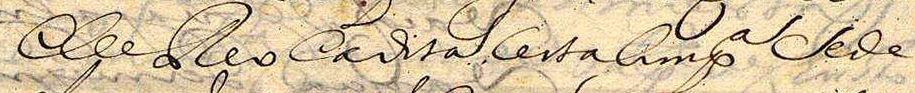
elle Reo e a dita certa Compa Se de
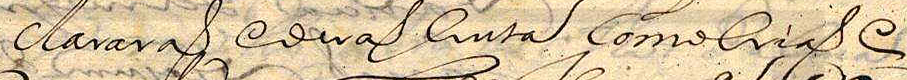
clararaõ e deraõ Conta Como Criaõ e
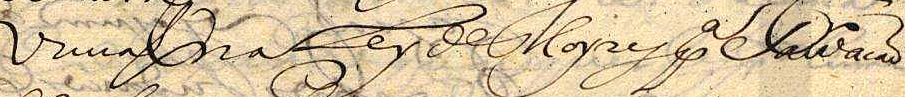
viuiaõ na Ley de Moyzes pa Salvaçaõ
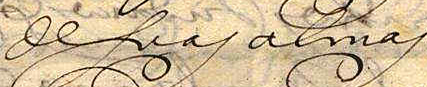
de suas almas
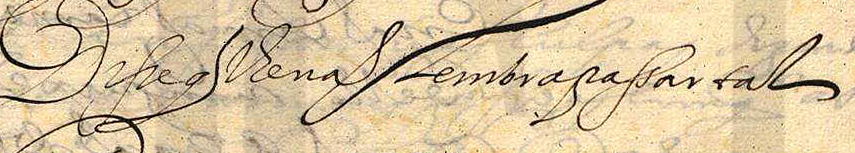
Disse q̄ lhe naõ Lembra passar taL
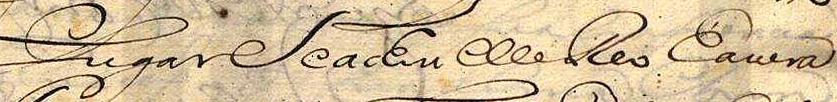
Lugar Se achou elle Reo hauera
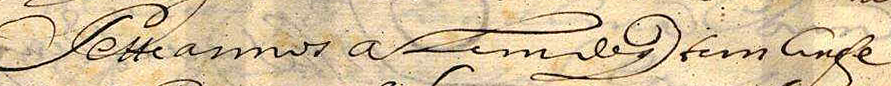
Sette annos aLem do q̄ tem Confe
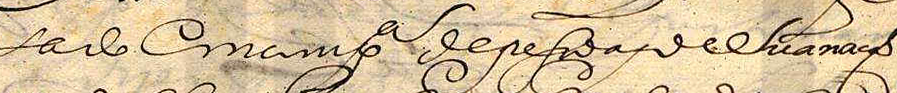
sado Em compa de pessoas de Sua naçaõ
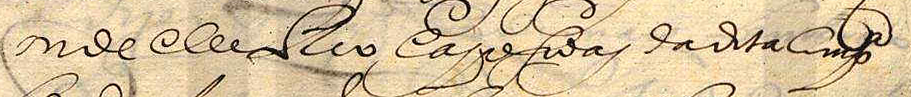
onde elle Reo e as pessoas da dita Compa
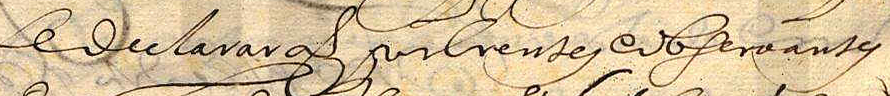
se declararaõ por Crentes e observantes
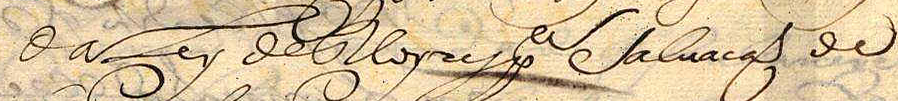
da Ley de Moyzes pa Saluaçaõ de
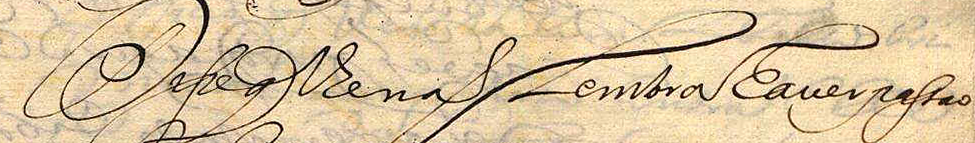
Disse q̄ lhe naõ Lembra hauer passao
